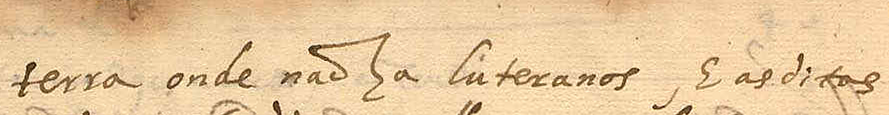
terra onde naõ ha luteranos, E as ditas
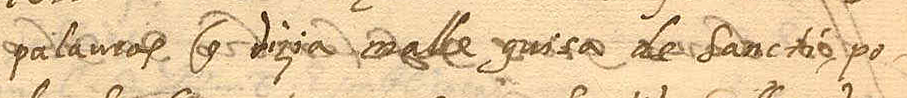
palauras q̄ dizia malle guisa de Sancti po
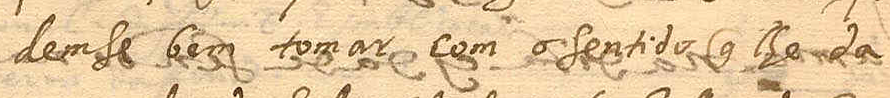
demse bem tomar com o sentido q̄ lhe da
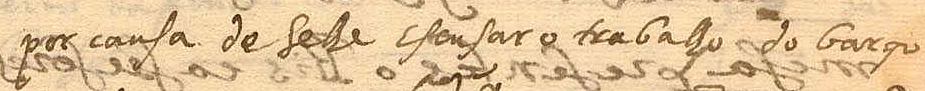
por causa de se lhe Escusar o trabalho do barqo
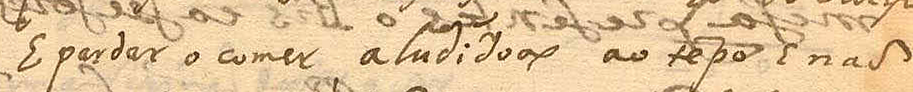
E perder o comer aludīdoas ao tēpo E naõ
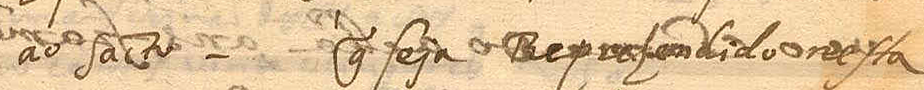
ao sācto - q̄ seja Reprehendido nesta
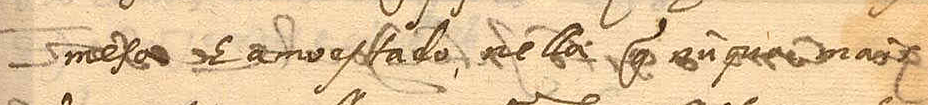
mesa E amoestado, nella q̄ nūqua mais
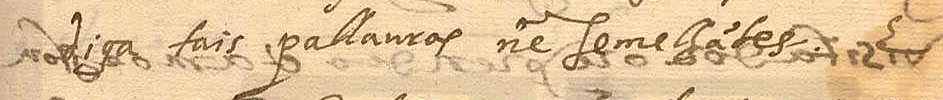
diga tais pallauras nē semelhātes. E
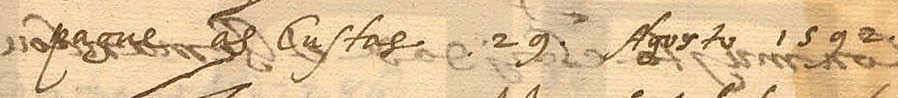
pague as Custas 29. Agosto 1592.
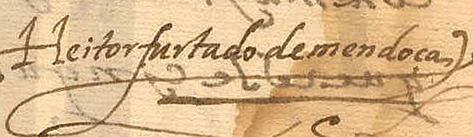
Heitor furtado de mendoça
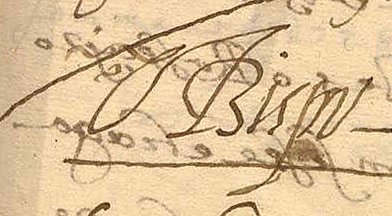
O Bispo
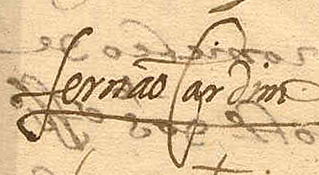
fernaõ Cardim
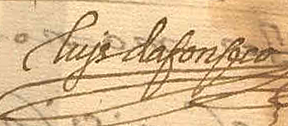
lujs dafonseca
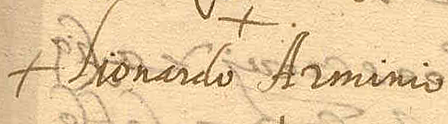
Lionardo Arminio
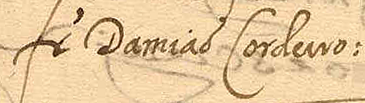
fr̄ Damiaõ Cordeiro
